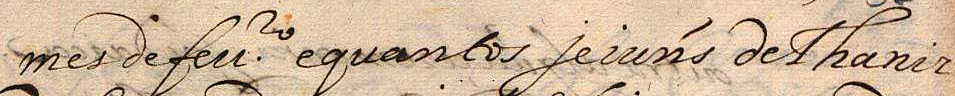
mes de feu.ro e quantos jeiun̄s de Thaniz
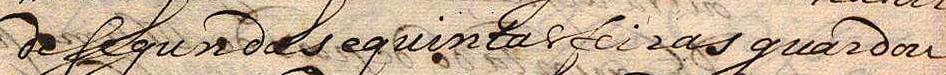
de segundas e quintas feiras guardou
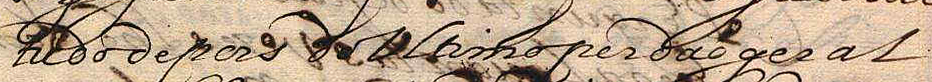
tudo depois do vltimo perdaõ geraL
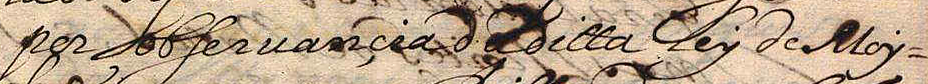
por obseruançia da ditta Ley de Moy
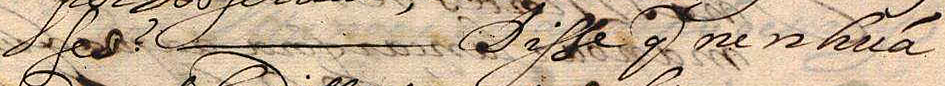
ses? - Disse q̄ nenhuā
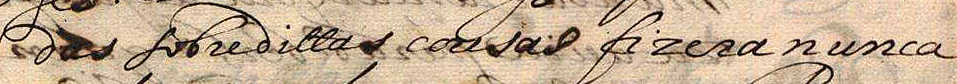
das sobredittas cousas fizera nunca
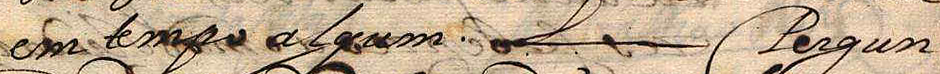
em tempo algum. - Pergun
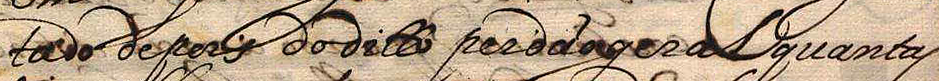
tado depois do ditto perdaõ geral quantas
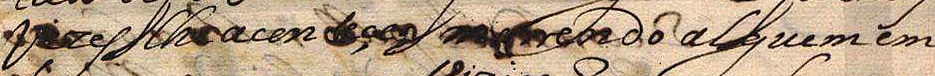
vezes lhe aconteçeo morrendo alguem em
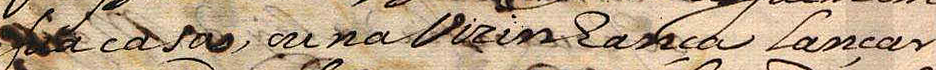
sua casa, ou na vizinhança lançar
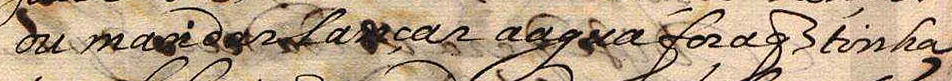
ou mandar lançar a agua fora q̄ tinha
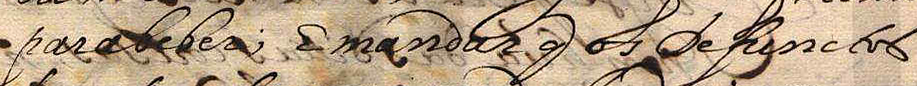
para beber; E mandar q̄ os Defunctos
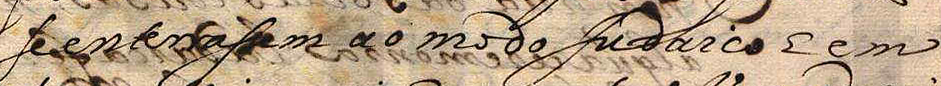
se enterrassem ao modo Judaico E em
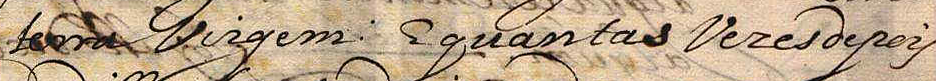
terra Virgem: E quantas Vezes depois
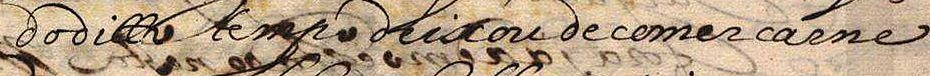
do ditto tempo deixou de comer carne
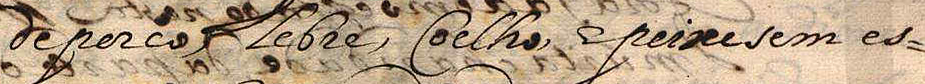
de porco, lebre, Coelho, E peixe sem es
